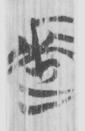麥
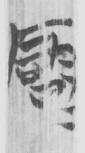{石旬}=
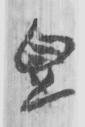見
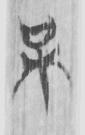某
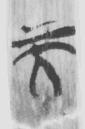而
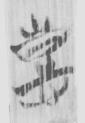𢝫
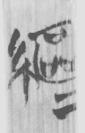{糸區}=
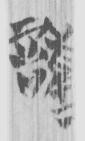諥=
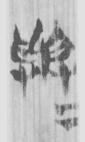與=
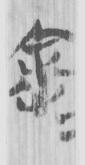悆=
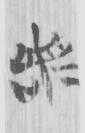若
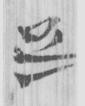隧
